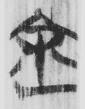余
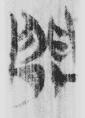{門外}
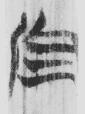於
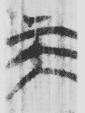天
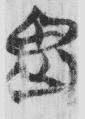畏
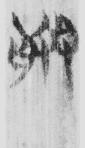朕
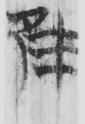隹
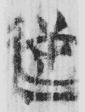逆
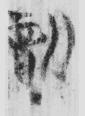訓
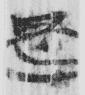是
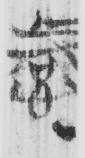𢝬
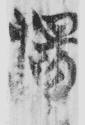湯
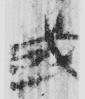或
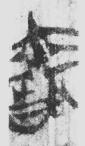{尒䎽}
